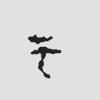亓（其）
